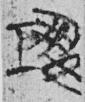○（鞏）
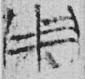用
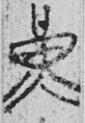黃
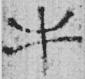牛
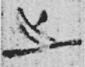之
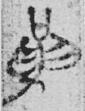革
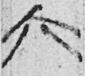六
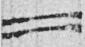二
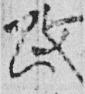攺
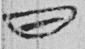日
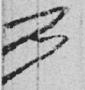乃
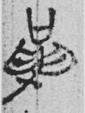革
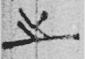之
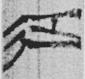征
